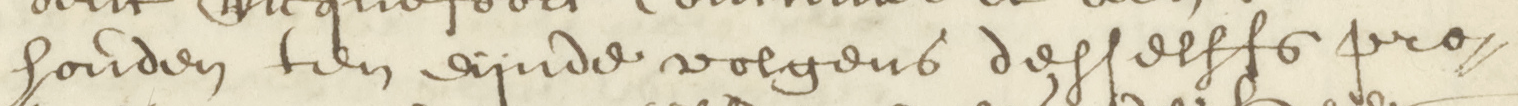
houden ten eijnde volgens desselffs pro„
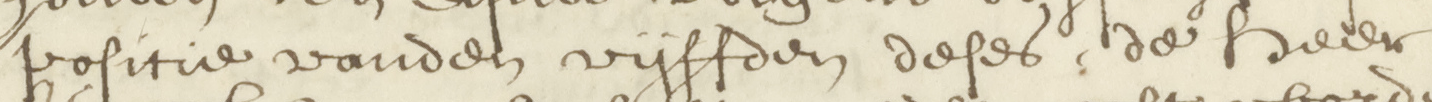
positie vanden vijffden deses, de Heer
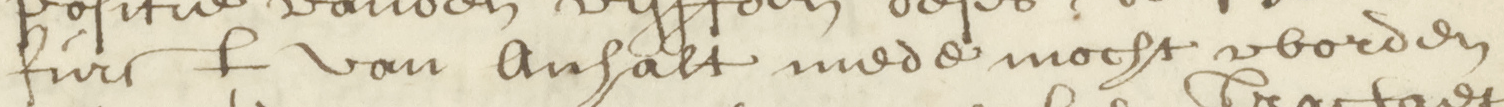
furst van Anhalt mede mocht worden
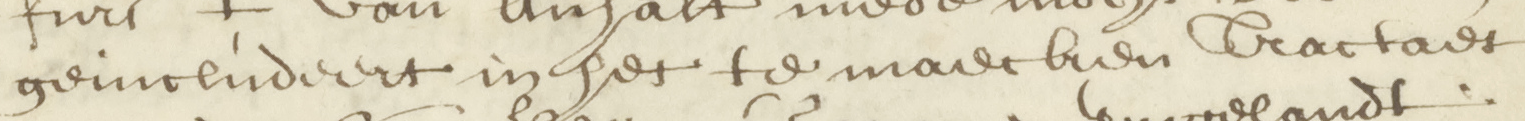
geincludeert in het te maecken Tractaet
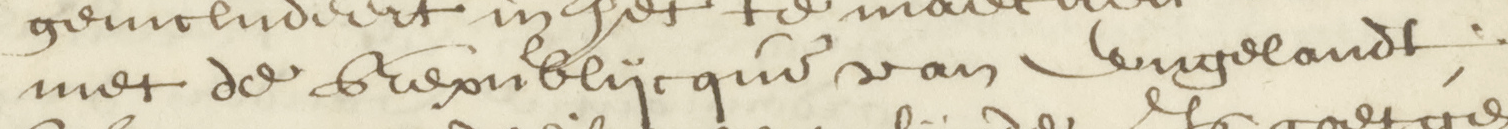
met de Republijcque van Engelandt;
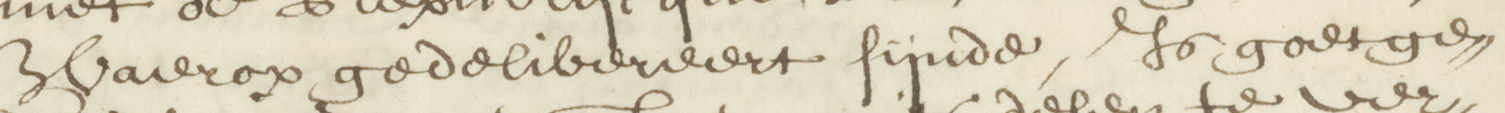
Waerop gedelibereert sijnde, Is goetge,
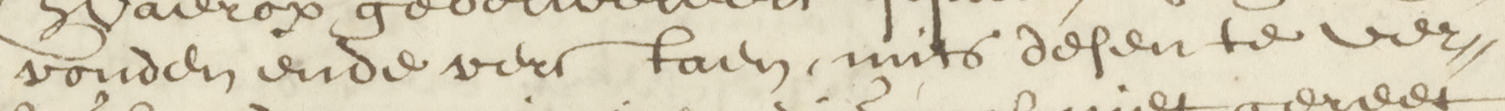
vonden ende verstaen, mits desen te ver„
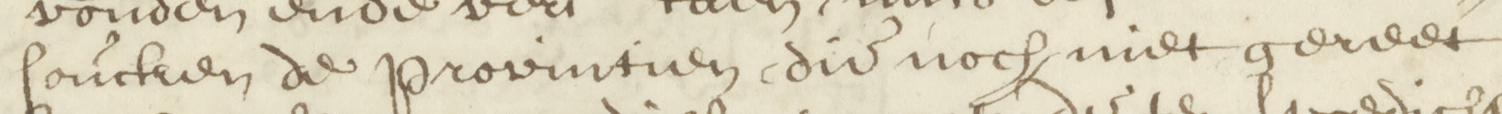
soucken de provintien, die noch niet gereet
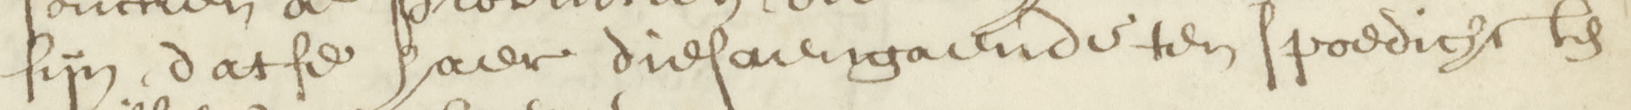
sijn, datse haer diesaengaende ten spoedichsten
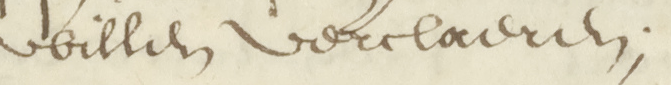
willen verclaeren;
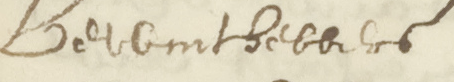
Bewinthebbers
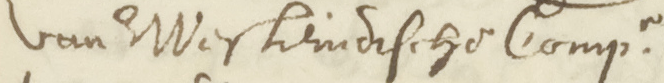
van Westindische Compe.
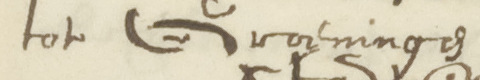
tot Groeningen
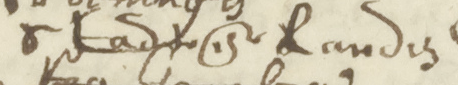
Stadt & Landen
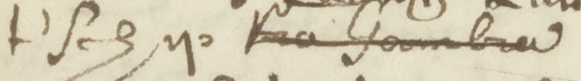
t'schip sxx Gxxxbxx
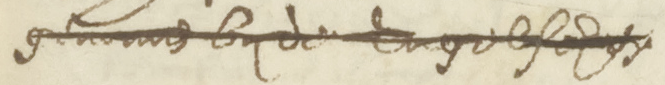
genoomen bij de Engelschen
